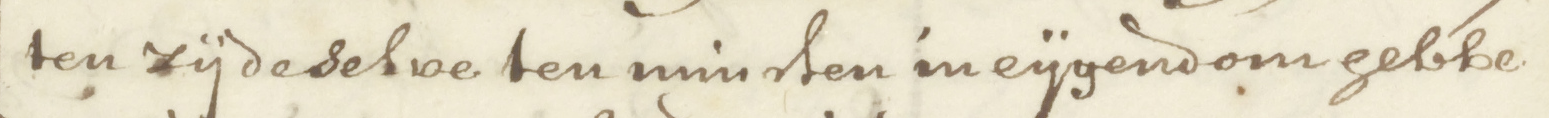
ten zij deselve ten minsten in eijgendom hebbe
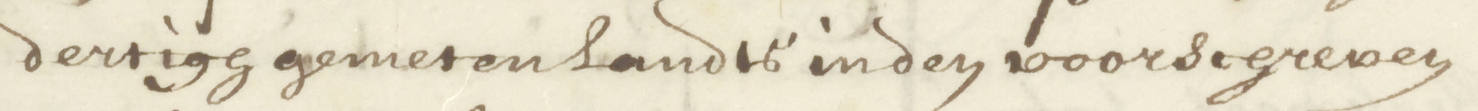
dertigh gemeten Landts inden voorschreven
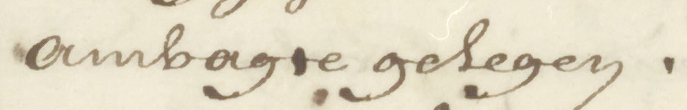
Ambagte gelegen.
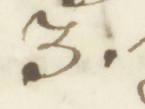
3.
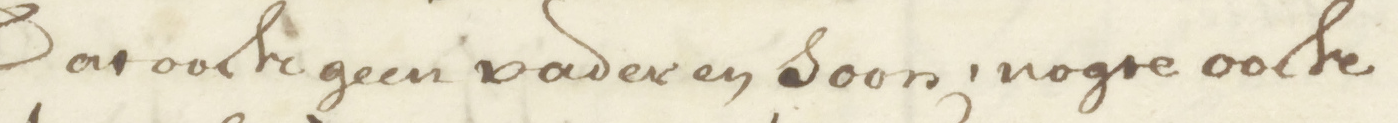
Dat oock geen vader en Soon, nogte oock
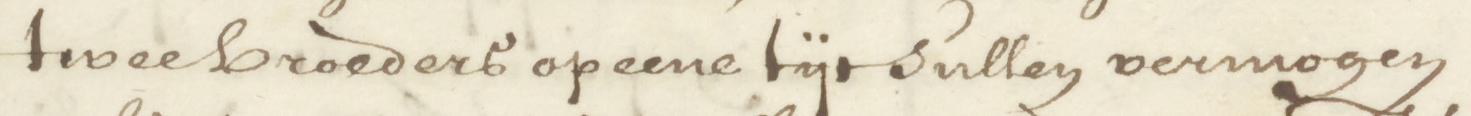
twee broeders opeene tijt sullen vermogen
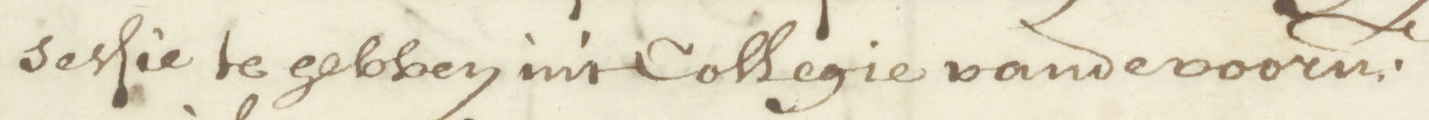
sessie te hebben in‛t Collegie vande voorn
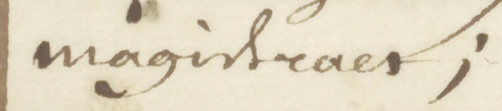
magistraet:
